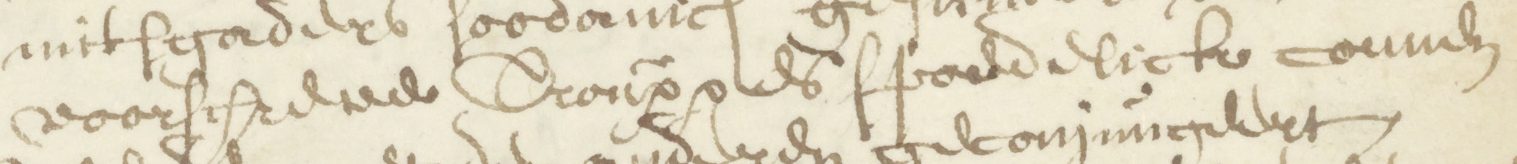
voorschreve Trouppes spoedelick connen
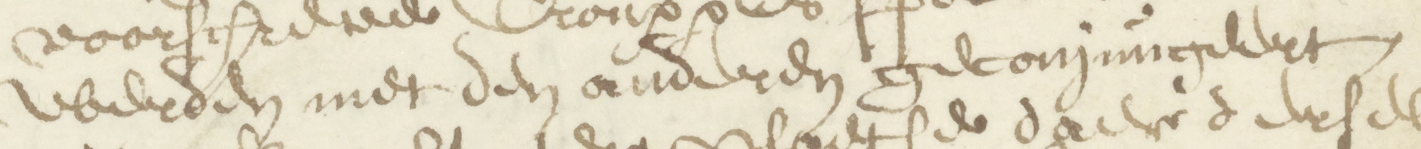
werden met den anderen geconjungeert,
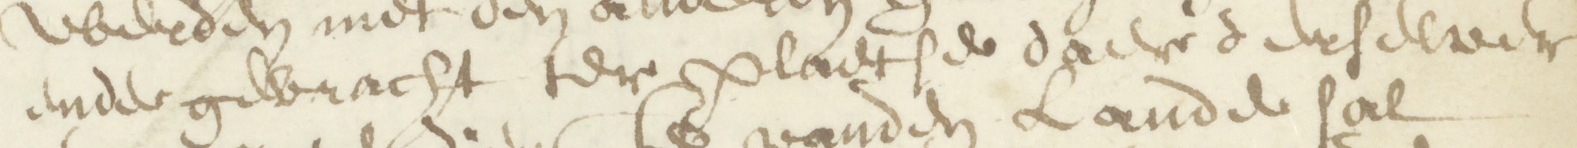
ende gebracht ter plaetse daer derselver
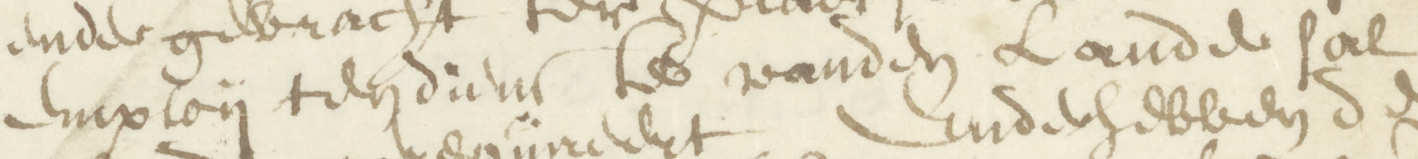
emploij ten dienste vanden Lande sal
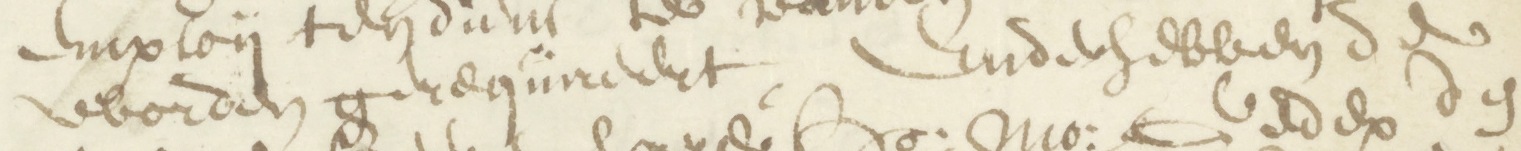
worden gerequireert, Ende hebben de
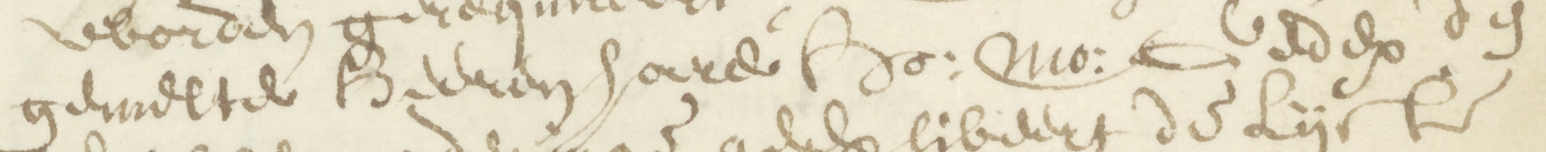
gemelte Heeren hare Ho:Mo: Gedepden
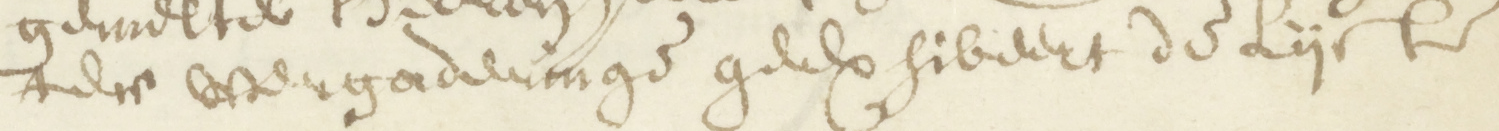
ter Vergaderinge geexhibeert de Lijste
